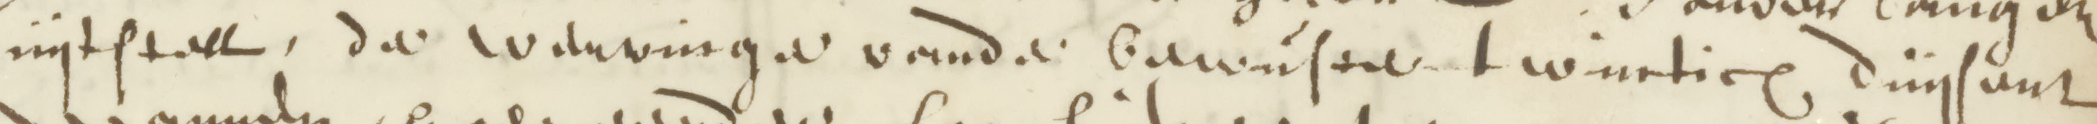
uijtstell, de wervinge vande bewuste twintich duijsent
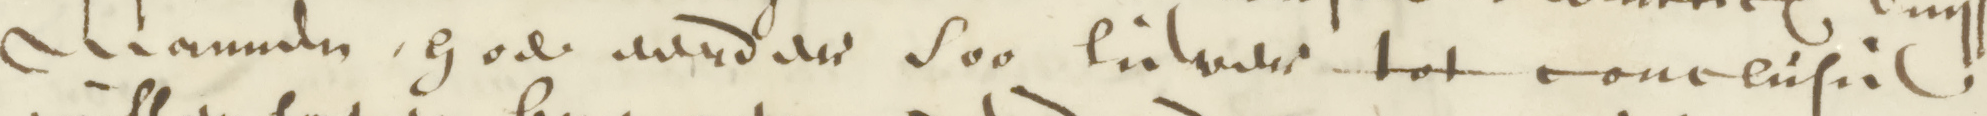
mannen, hoe eerder soo liever tot conclusie
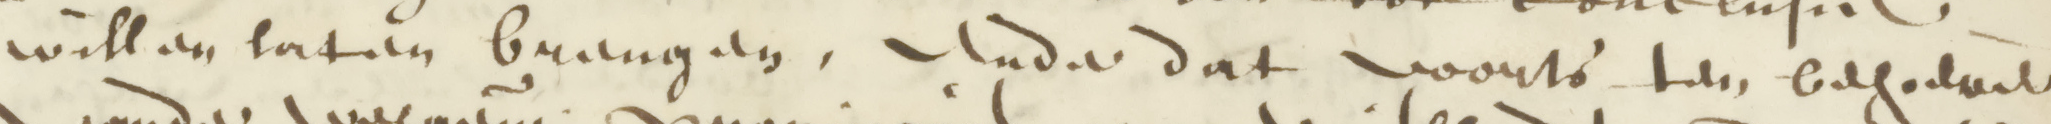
willen laten brengen, ende dat voorts ten behoeve
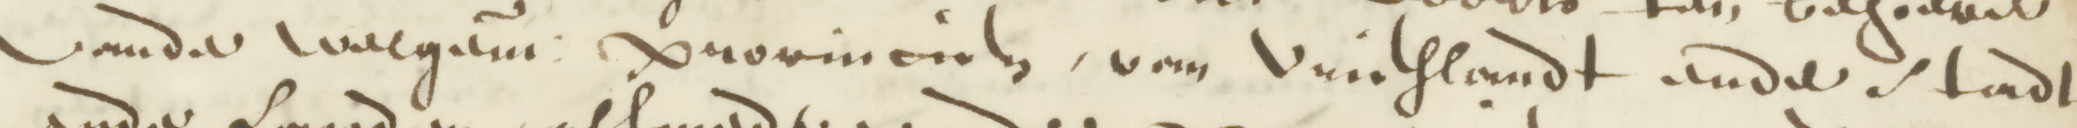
vande welgem: provincien, van Vrieslandt ende Stadt
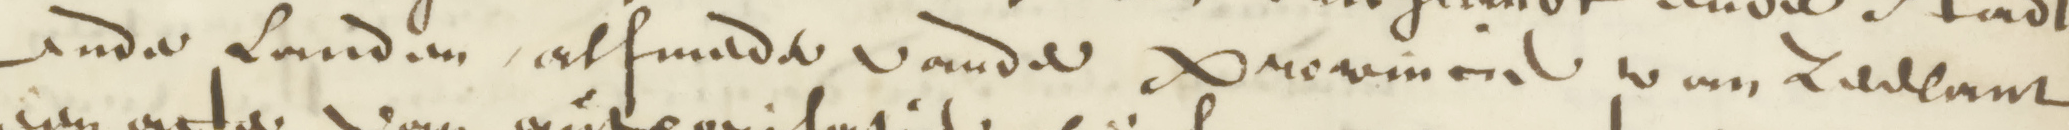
ende Landen, alsmede vande Provincie van Zeelant
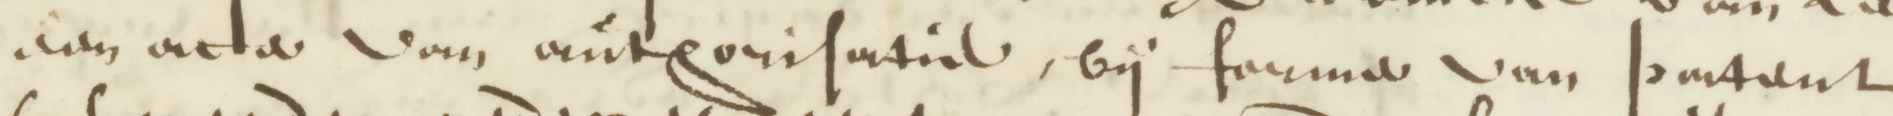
een acte van authorisatie, bij forme van patent
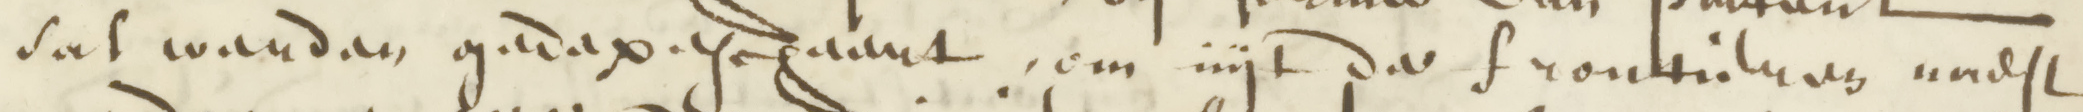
sal werden gedepescheert, om uijt de frontieren naest
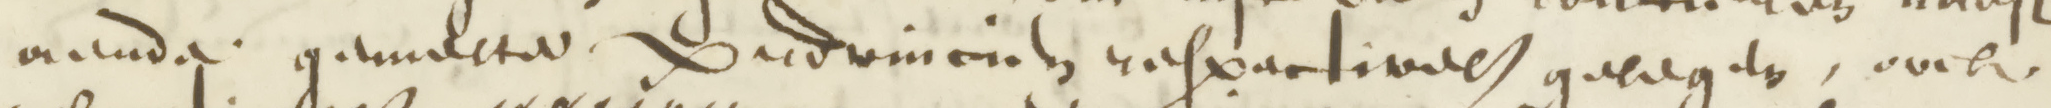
aende gemelte Provincien respectivel gelegen, oock
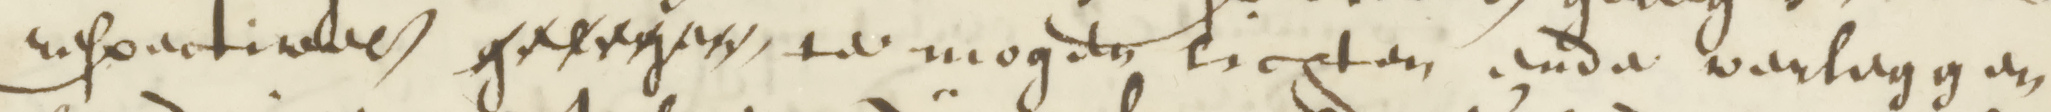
respectivel gelegen, te mogen lichten ende verleggen
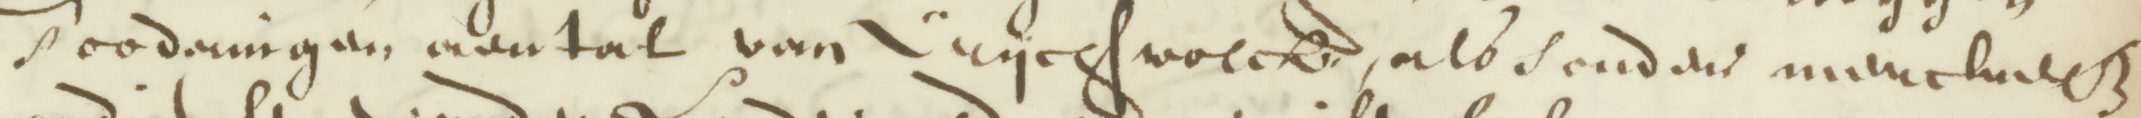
soodanigen aental van Crijchsvolck, als sonder merckel
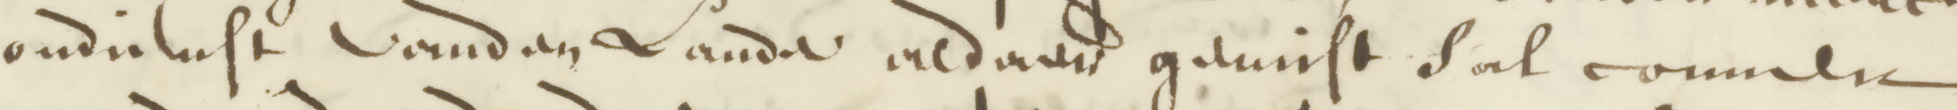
ondienst vanden Lande aldaer gemist sal connen
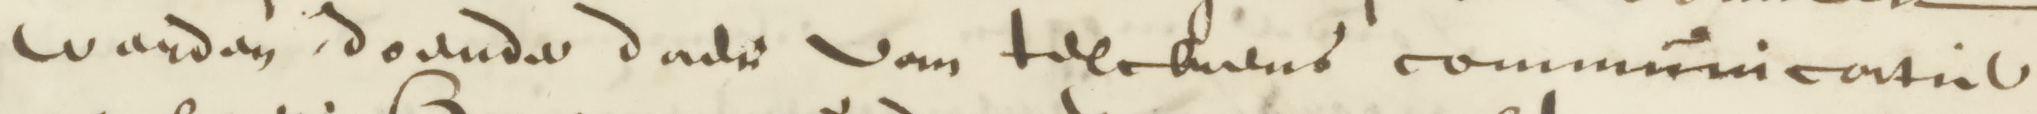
werden, doende daer van telckens communicatie
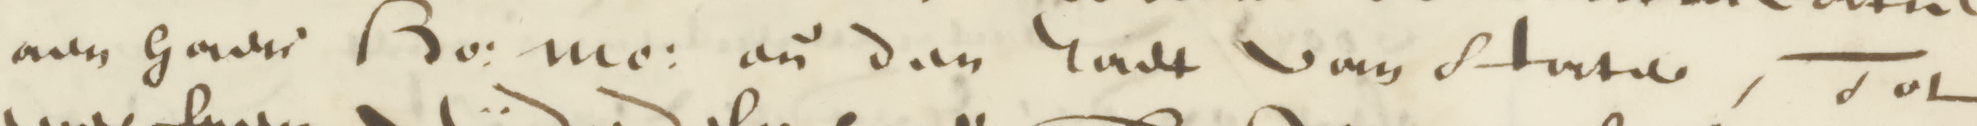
aen haer Ho:Mo: en den Raet van State, tot
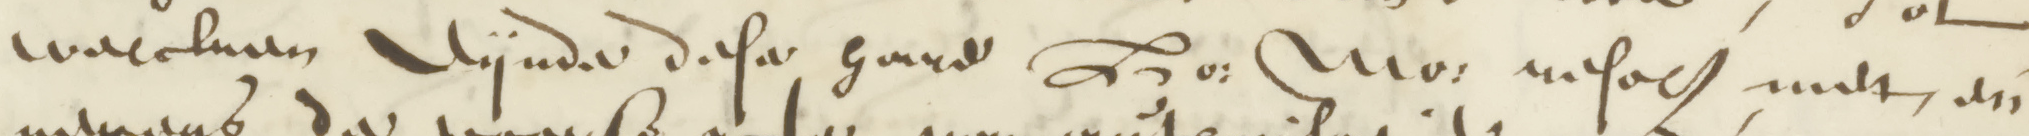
welcken Eijnde dese hare Ho:Mo: resol met, en
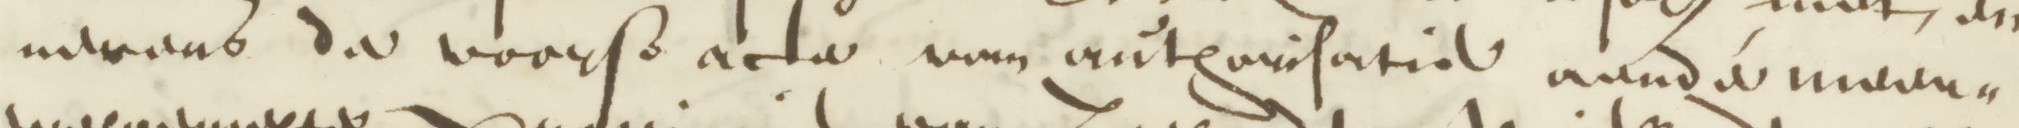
nevens de voors acte van authorisatie aende meer„
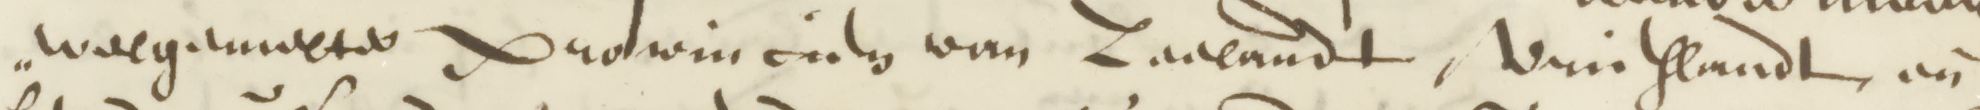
,,welgemelte Provincien van Zeelandt, Vrieslandt, en
